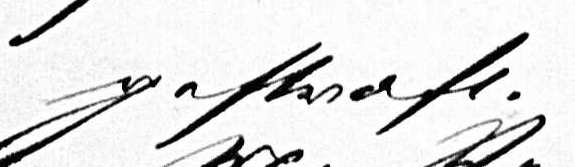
gestraft.
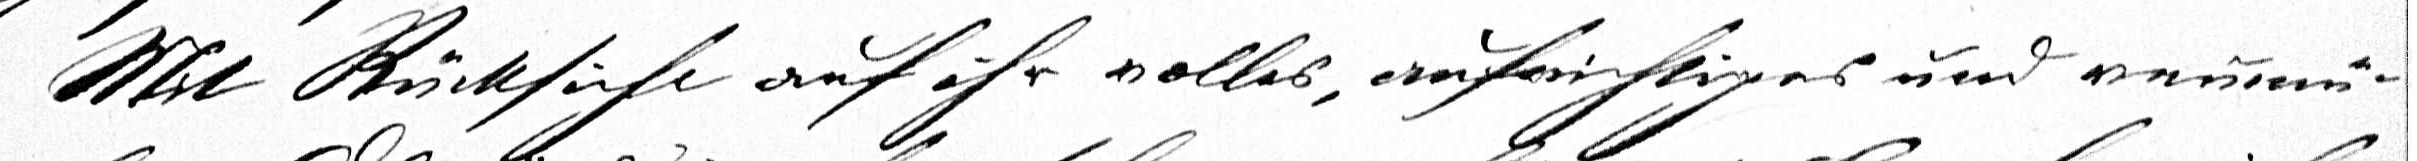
Mit Rücksicht auf ihr volles, aufrichtiges und reumü¬
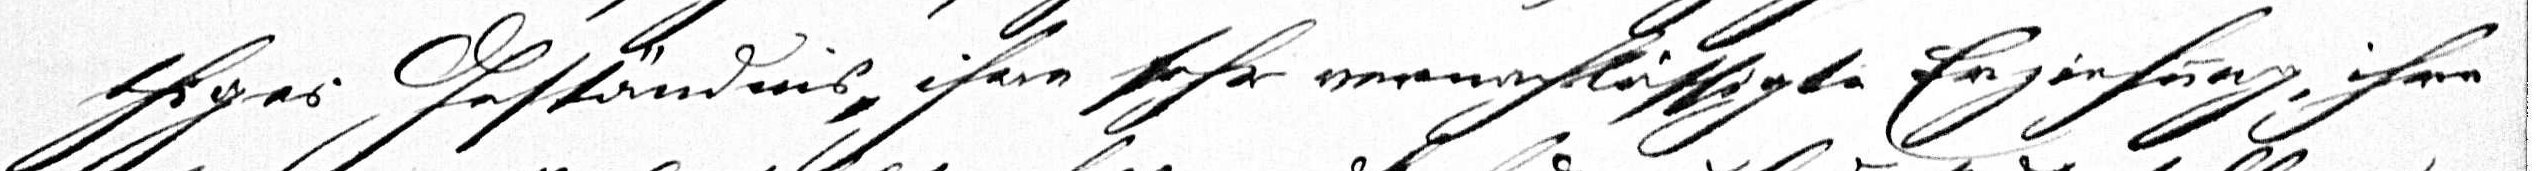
thiges Geständnis, ihre sehr vernachlässigte Erziehung, ihre
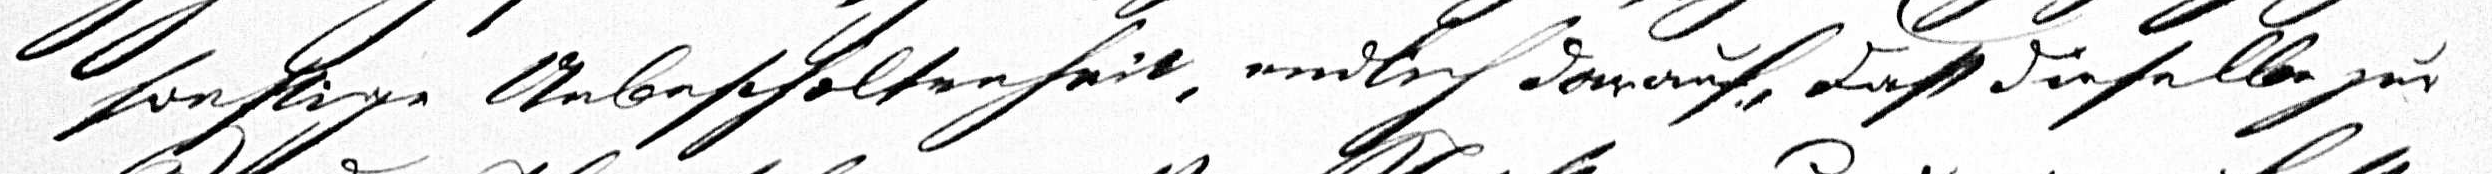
sonstige Unbescholtenheit, endlich darauf, daß dieselbe zur
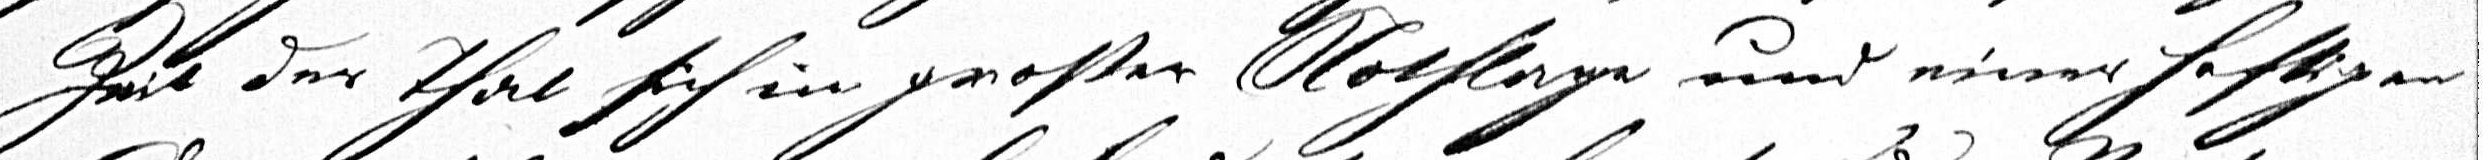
Zeit der That sich in großer Nothlage und einer heftigen
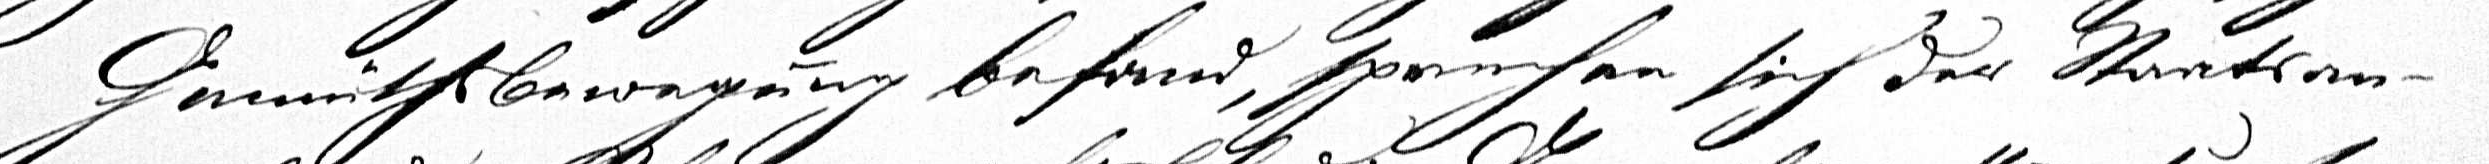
Gemüthsbewegung befand, sprechen sich der Staatsan¬
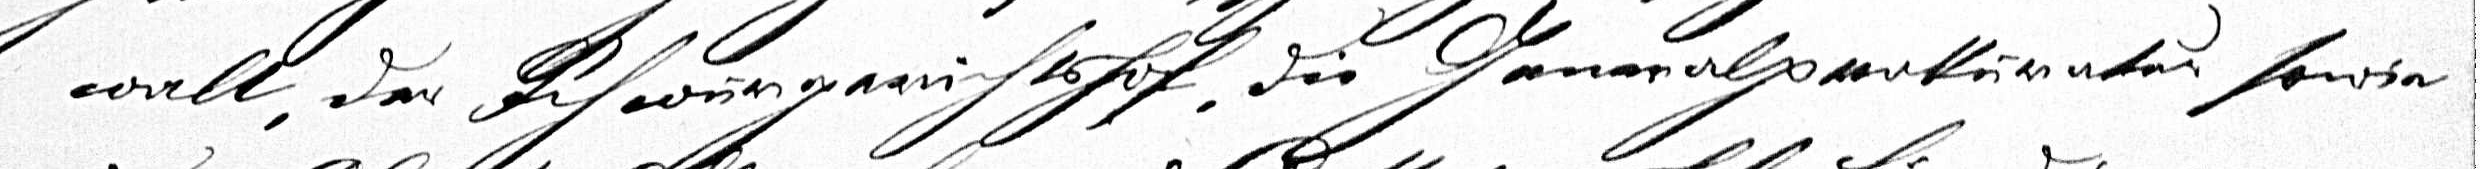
walt, der Schurgerichtshof, die Generalprokuratur sowie
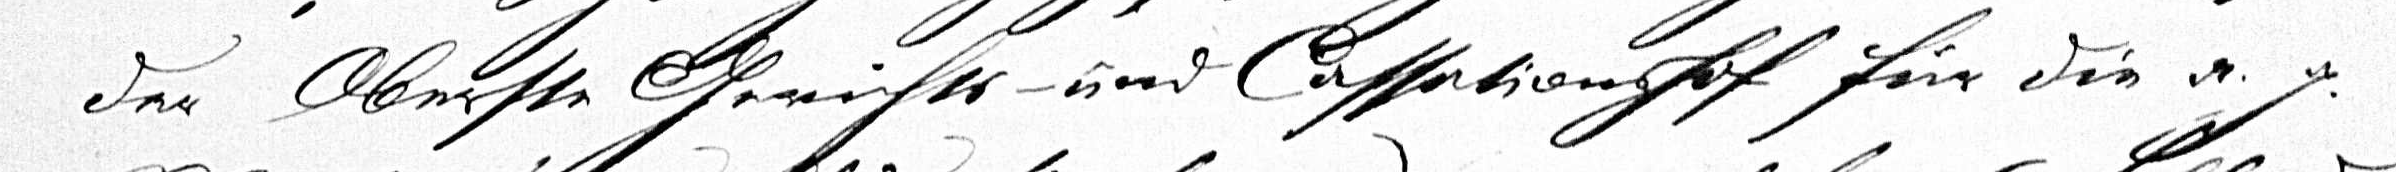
der Oberste Gerichts- und Cassationshof für die a.g.
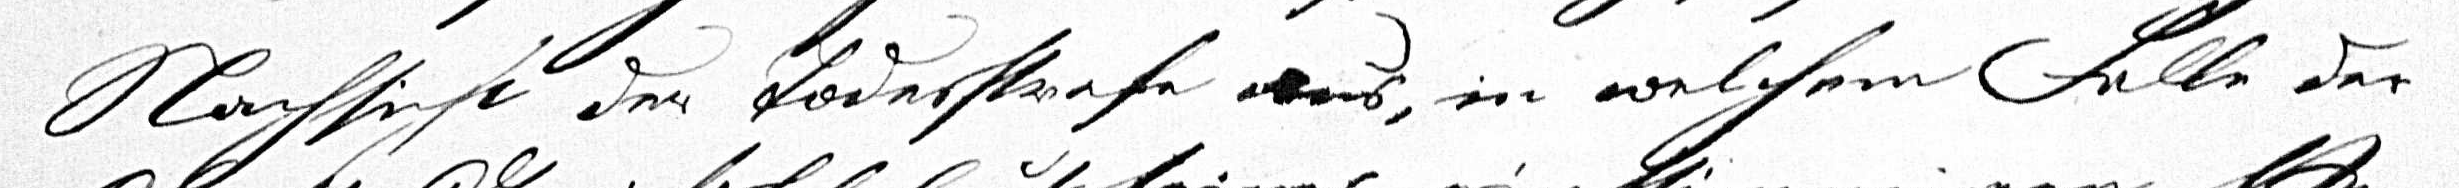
Nachsicht der Todesstrafe aus, in welchem Falle der
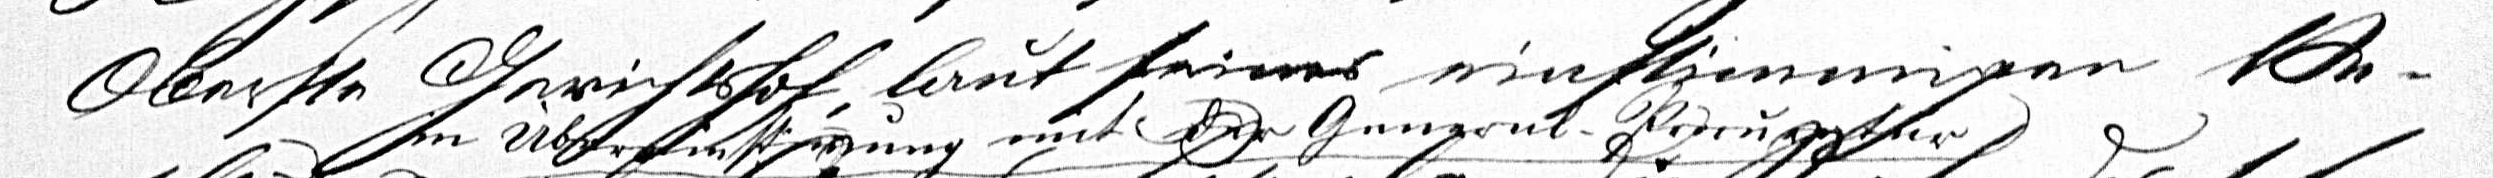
Oberste Gerichtshof laut seines einstimmigen Be¬
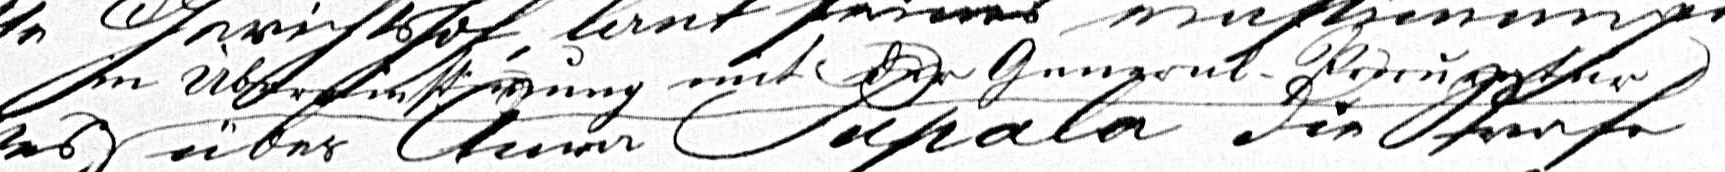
in Übereinstimmung mit der General Procuratur
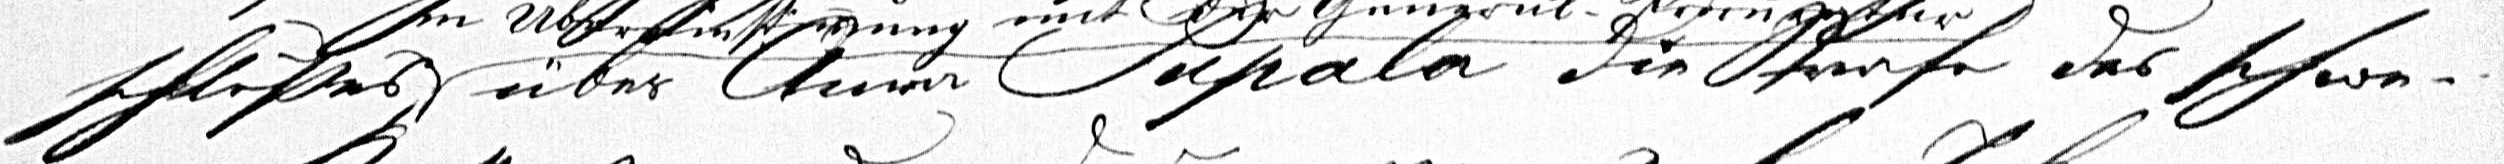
schlußes über Anna Pupala die Strafe des schwe¬
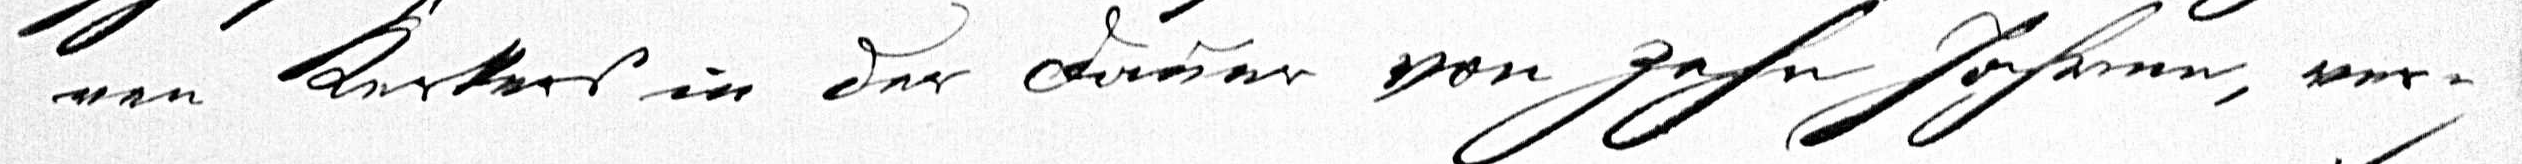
ren Kerkers in der Dauer von zehn Jahren, ver¬
